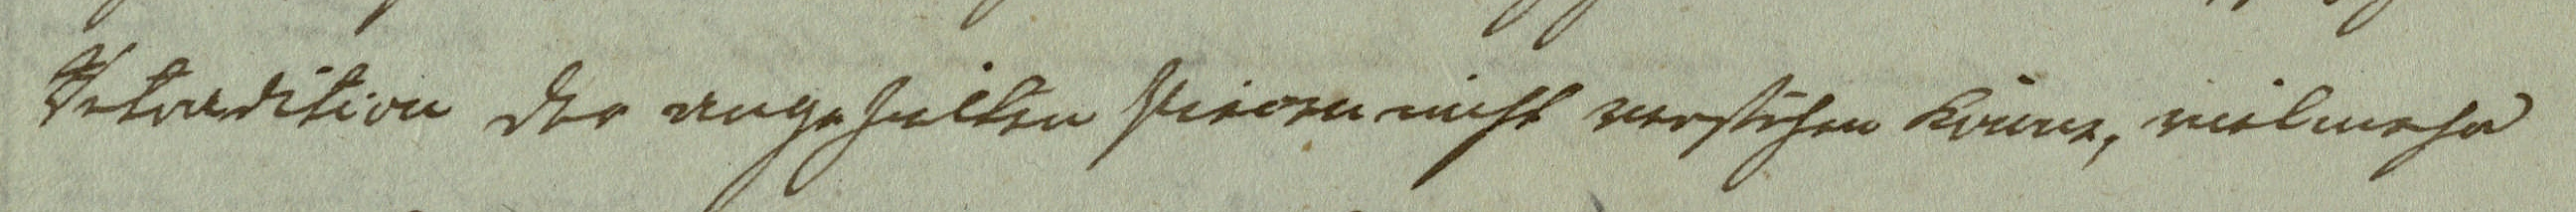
Retradition der angezielten Piecen nicht verstehen könne, vielmehr
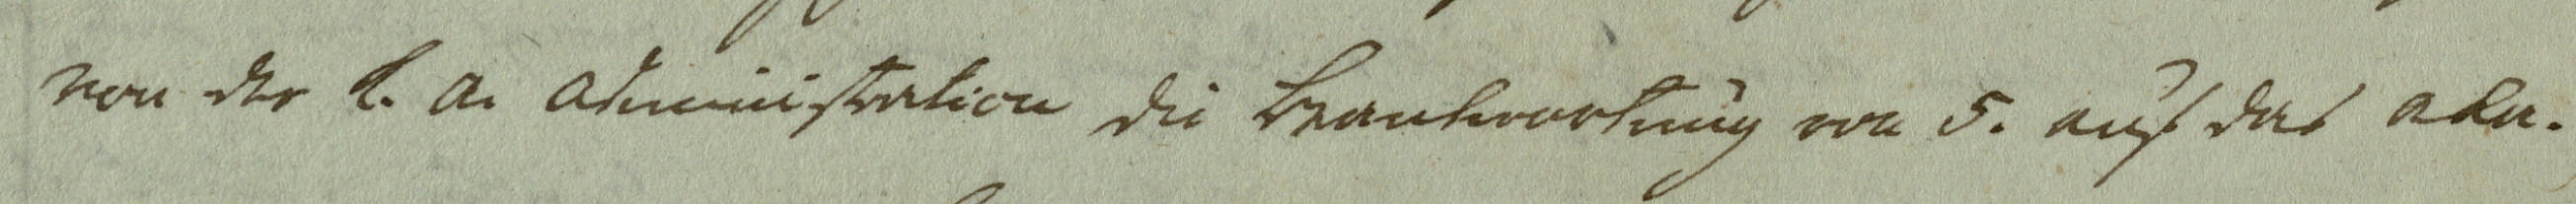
von der K. A. Administration die Beantwortung von 5. auf das aka¬
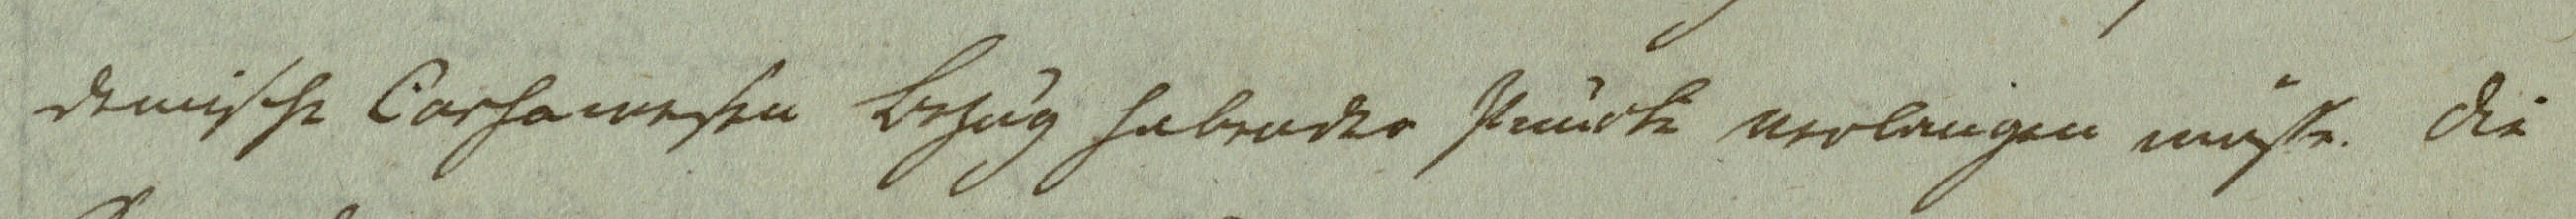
demische Cassawesen Bezug habender Puncte verlangen müsse. Die
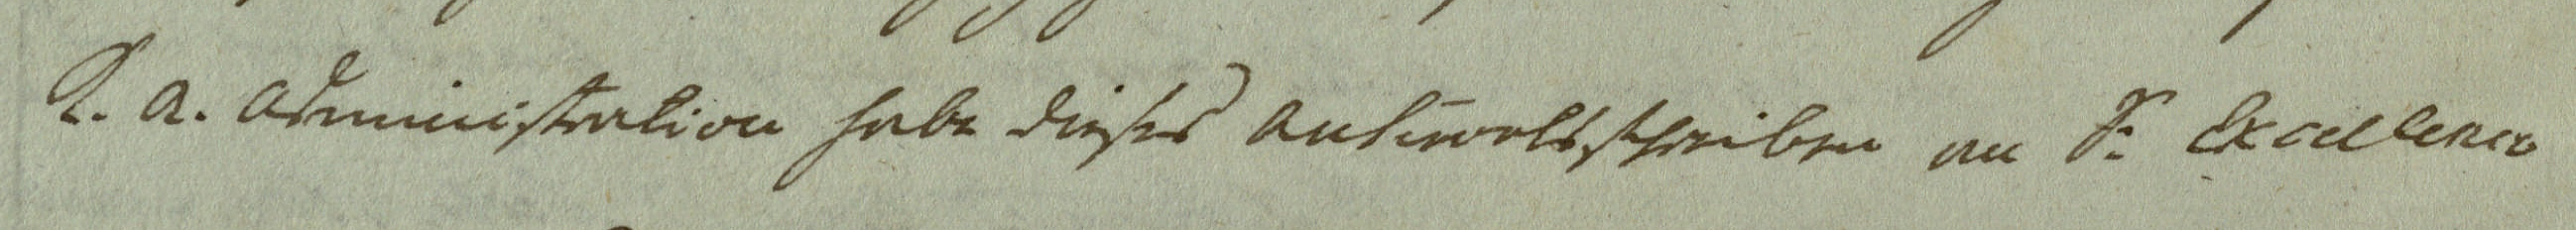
K. A. Administration habe dieses Antwortsschreiben an Sr. Excellence
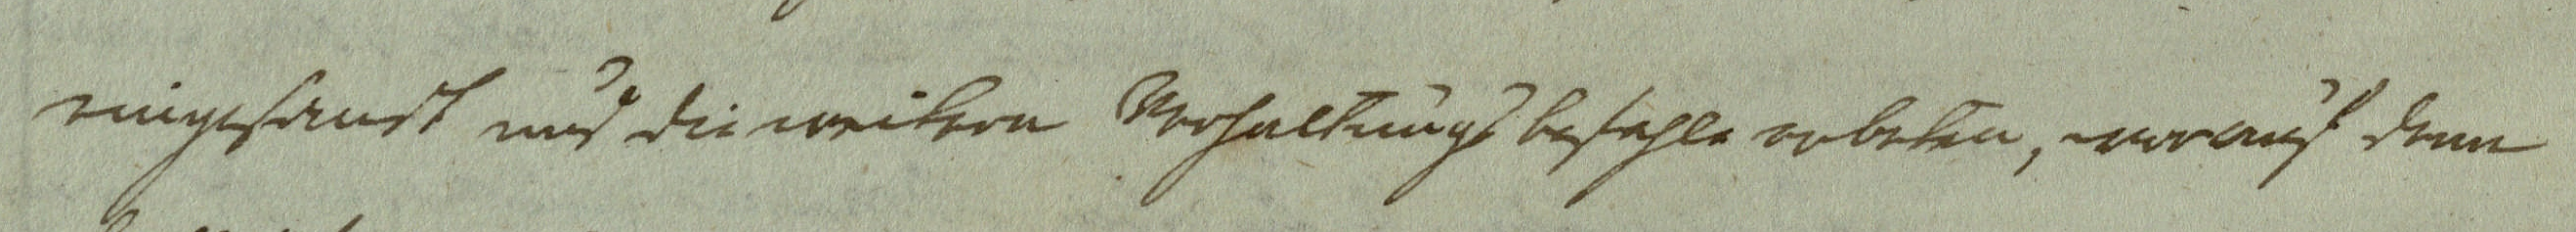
eingesandt und die weitern Verhaltungsbefehle erbeten, worauf denn
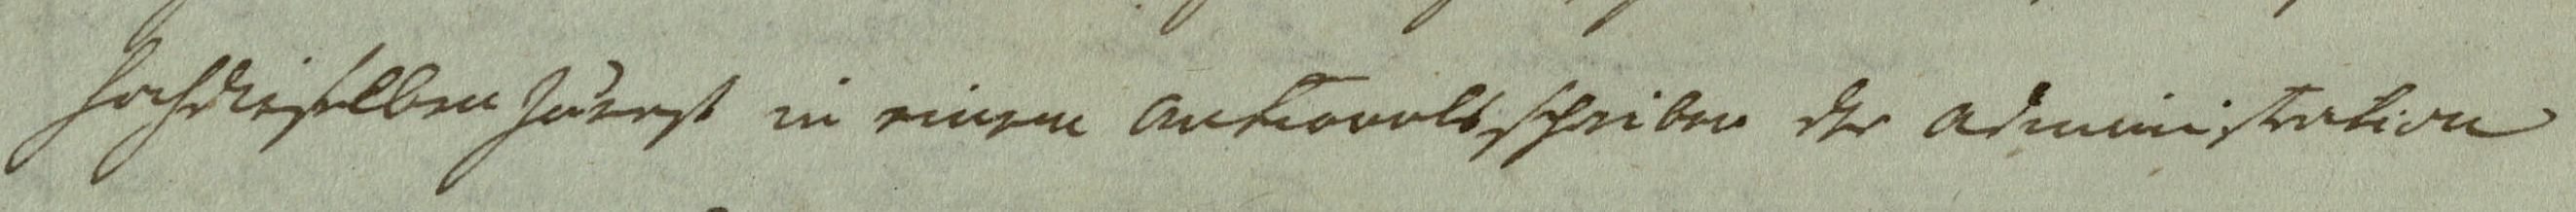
hochdieselben zuerst in einem Antwortsschreiben der Administration
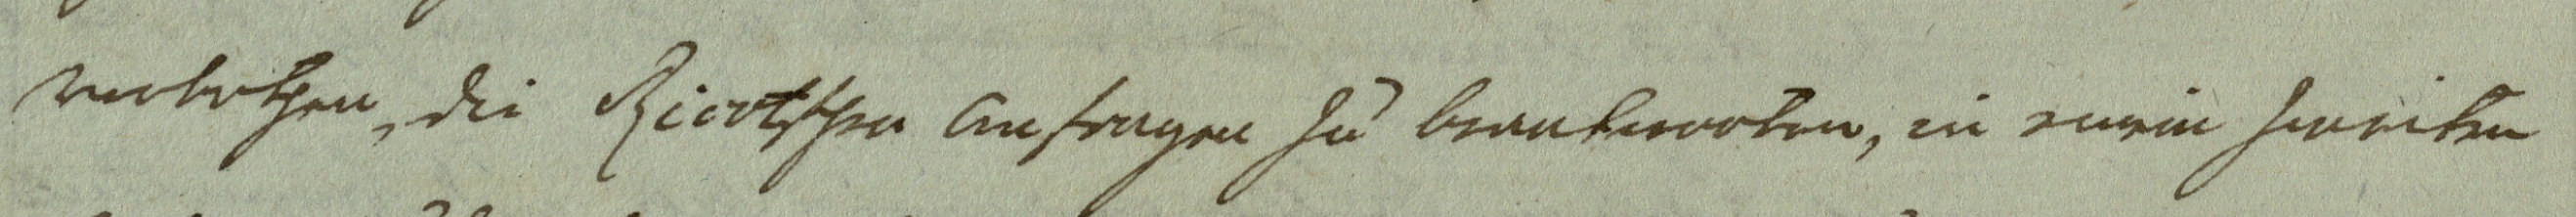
verbothen, die Ricotschen Anfragen zu beantworten, in einem zweiten
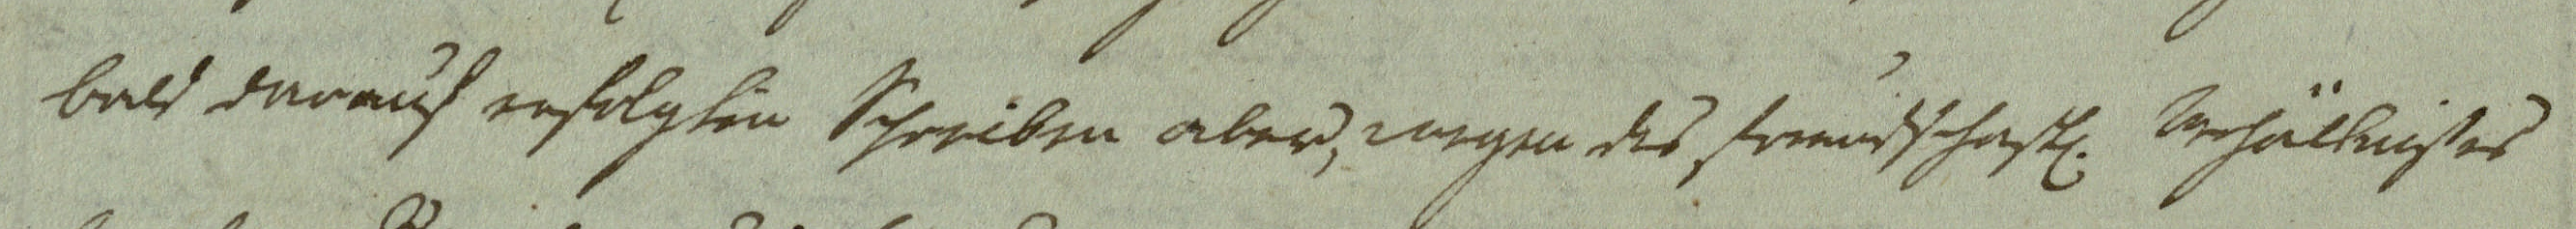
bald darauf erfolgten Schreiben aber, wegen des freundschaftl. Verhältnisses
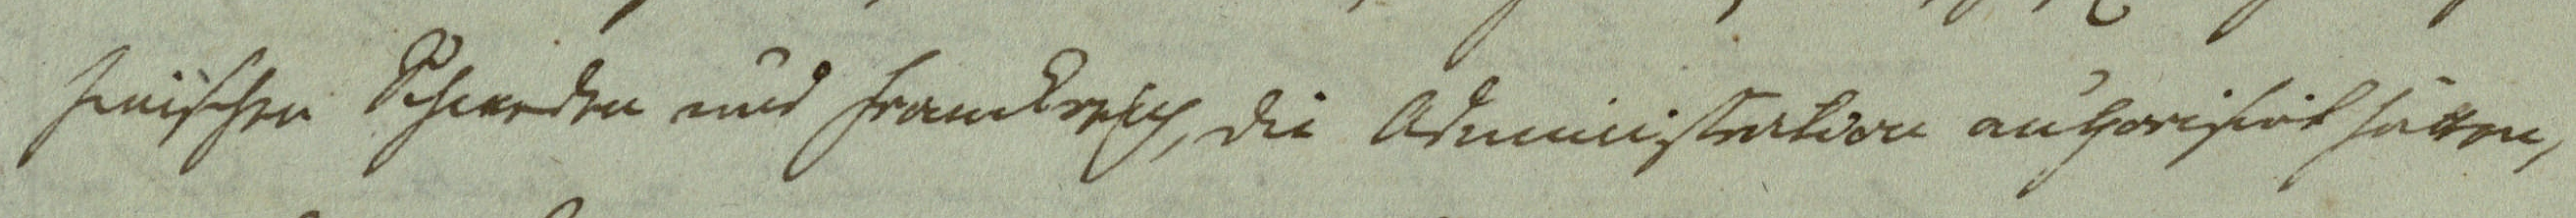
zwischen Schweden und Franckreich, die Administration authorisirt hätten,
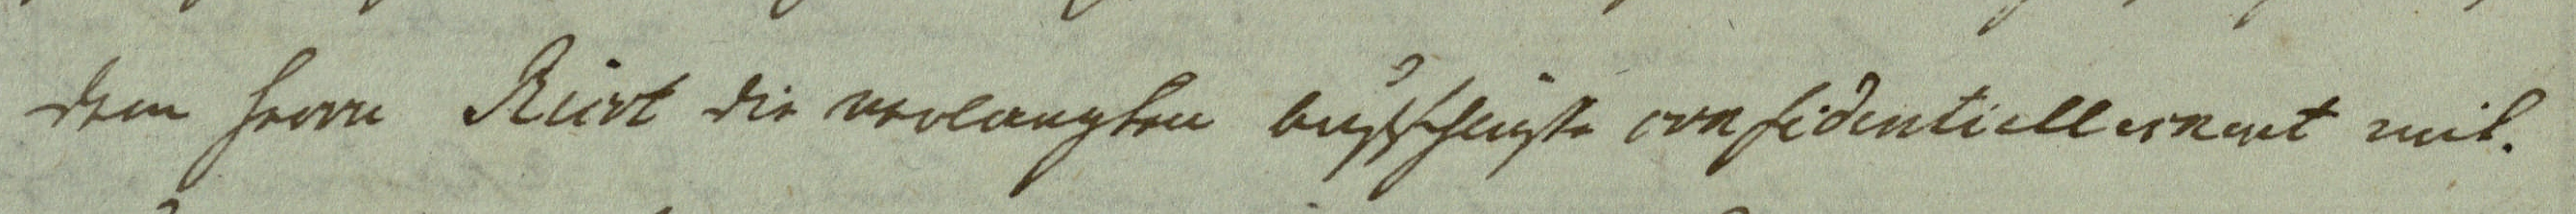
dem herrn Ricot verlangten Aufschlüsse confidentiell erneut mit¬
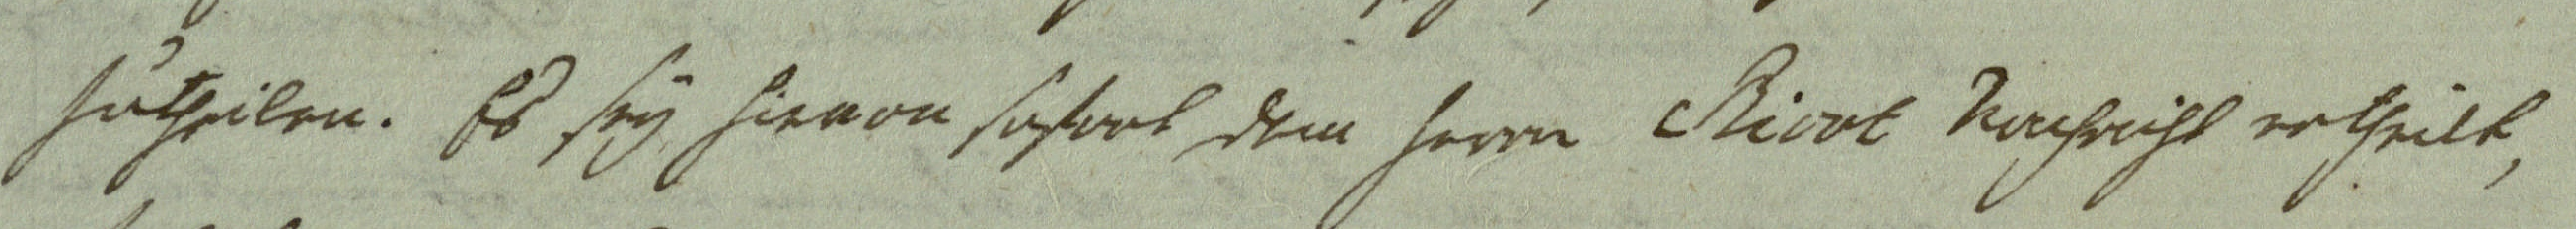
zutheilen. Es seÿ hievon sofort dem herrn Ricot Nachricht ertheilt,
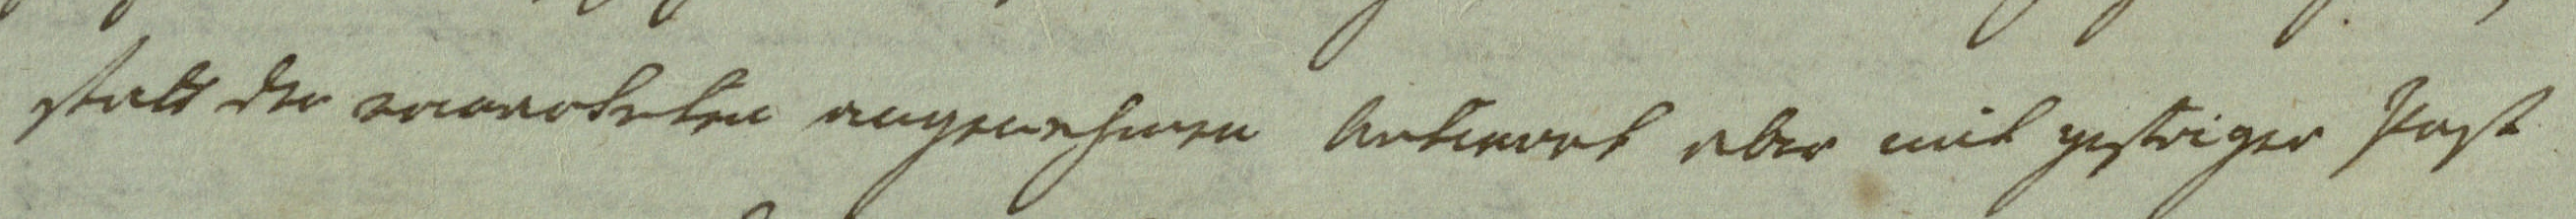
statt der erwarteten angenehmen Antwort aber mit gestriger Post
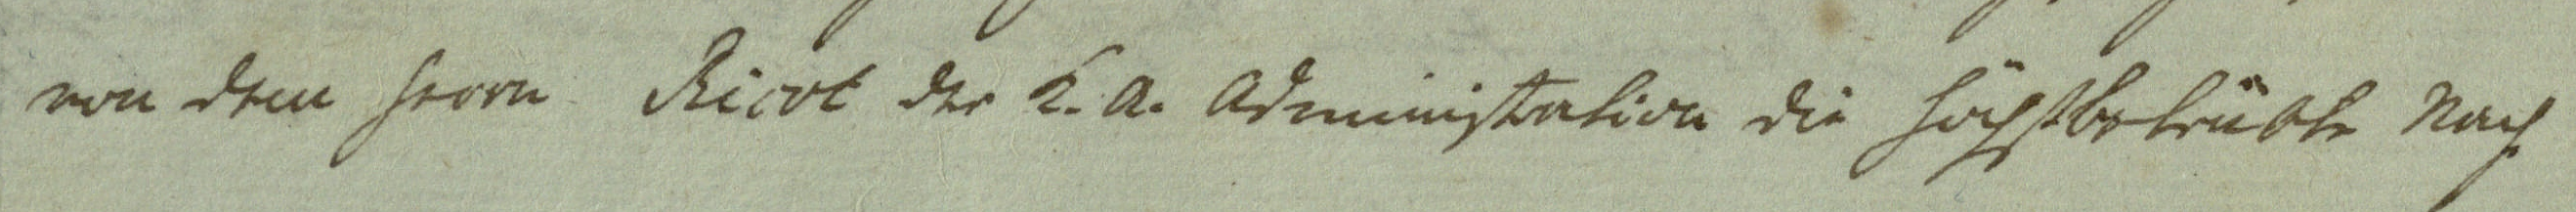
von dem herrn Ricot der K. A. Administration die höchstbetrübte Nach¬
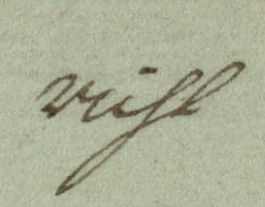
richt
